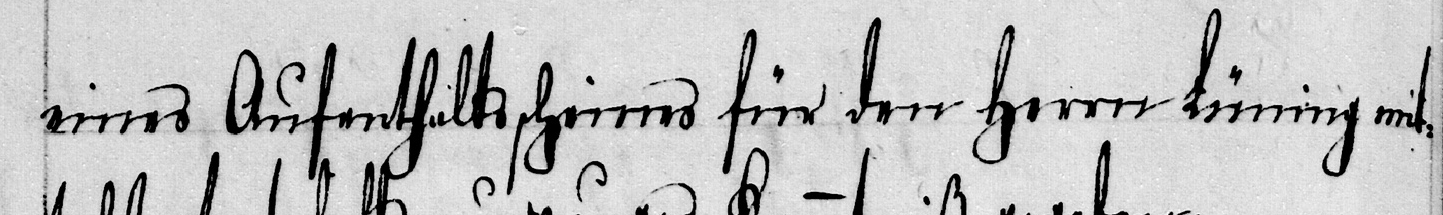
eines Aufenthaltsscheines für den Herrn Lüning mit¬
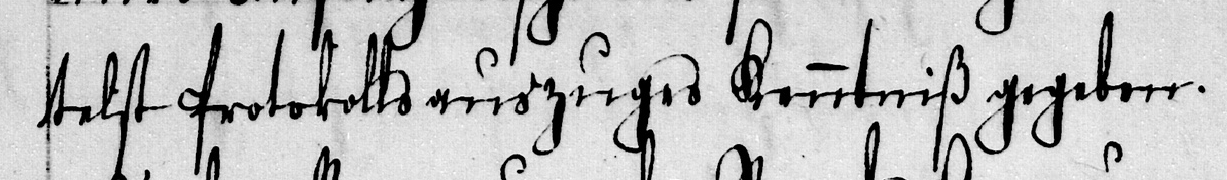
telst Protokollsauszuges Kenntniß gegeben.
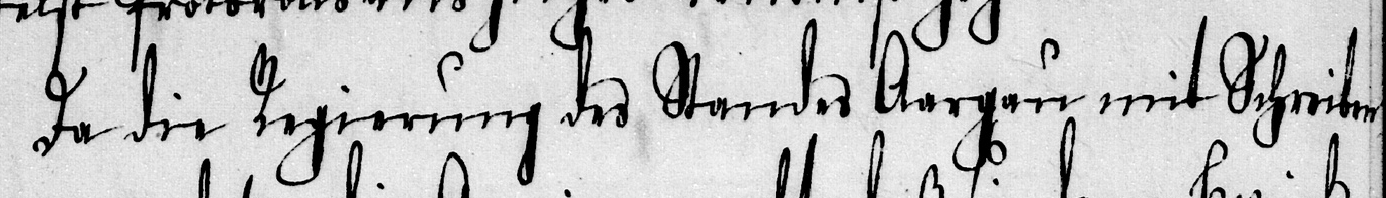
Da die Regierung des Standes Aargau mit Schrei¬
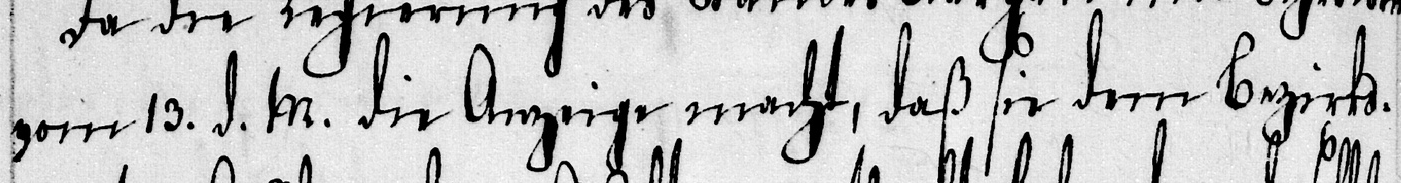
vom 13. d. M. die Anzeige macht, daß sie dem Bezirks¬
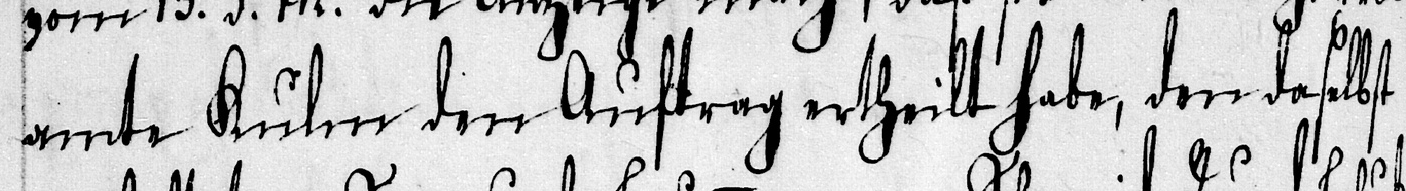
amte Kulm den Auftrag ertheilt habe, den dasel¬
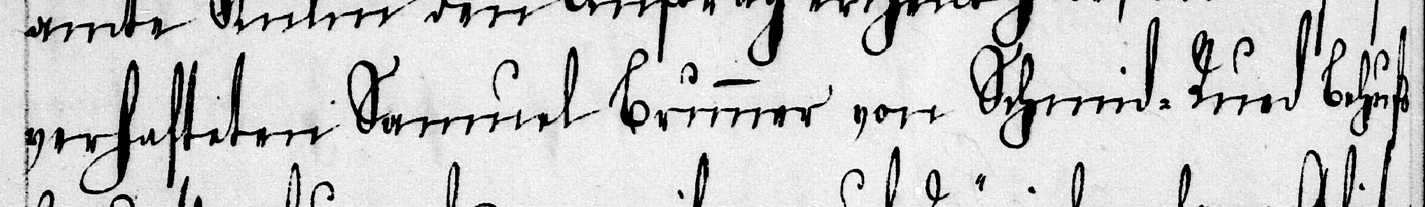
verhafteten Samuel Brunner von Schmid-Rued Behufs
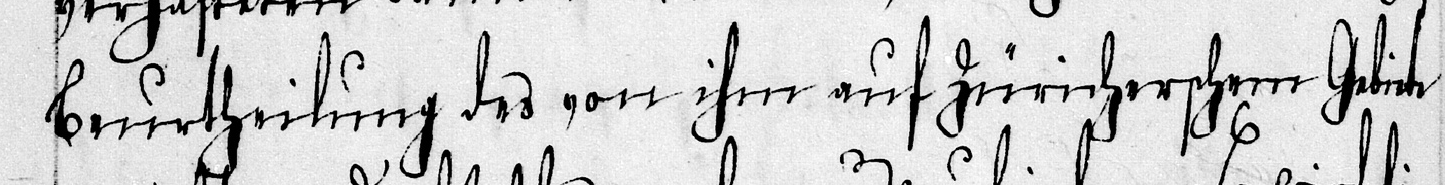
Beurtheilung des von ihm auf Züricherschem Gebie¬
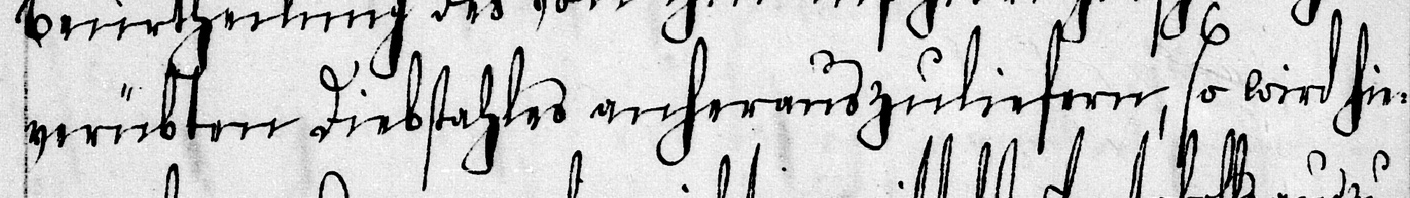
verübten Diebstahles anherauszuliefern, so wird hi¬
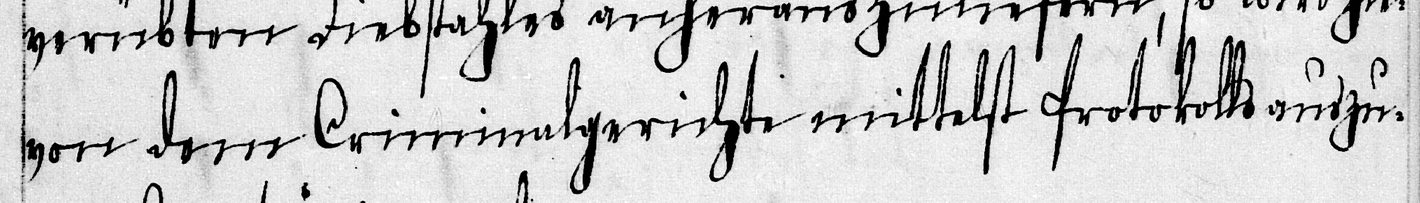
evon dem Criminalgerichte mittelst Protokollsauszu¬
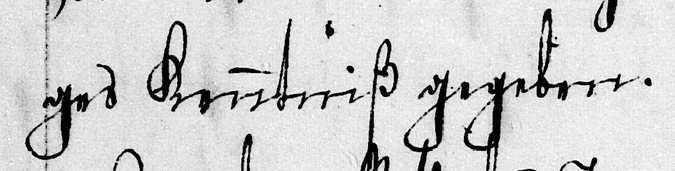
ges Kenntniß gegeben.
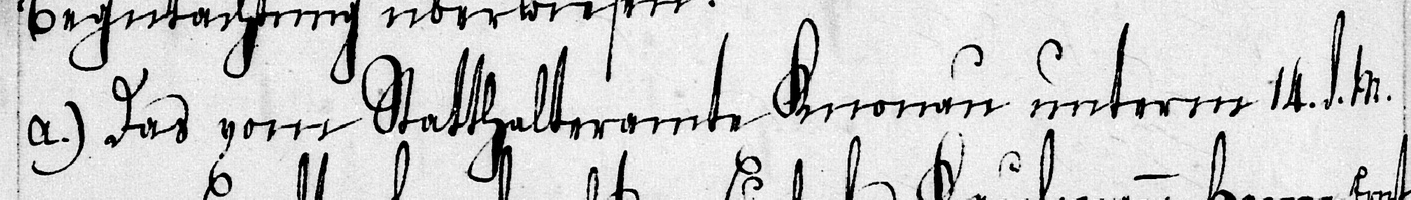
a.) Das vom Statthalteramte Knonau unterm 14. d.
